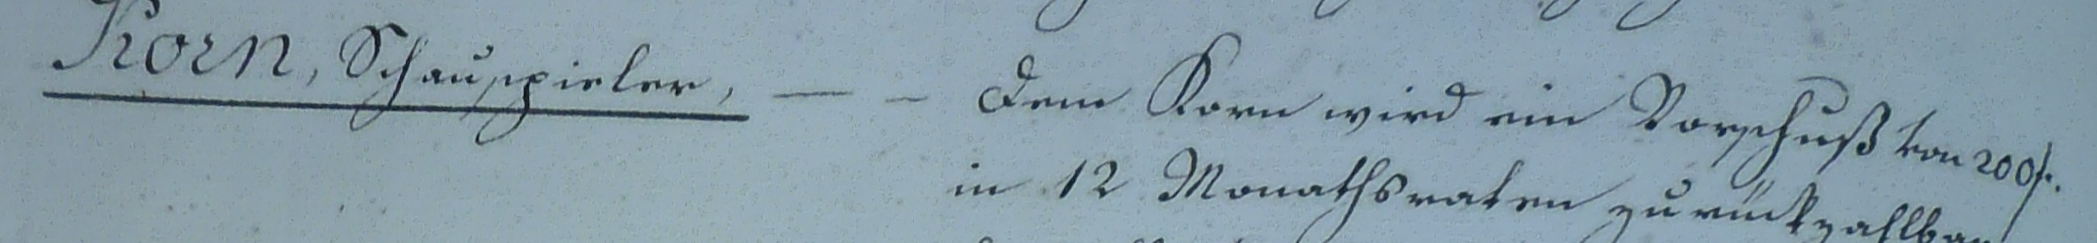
Korn, Schauspieler, __ _ Dem Korn wird ein Vorschuß von 200fr.
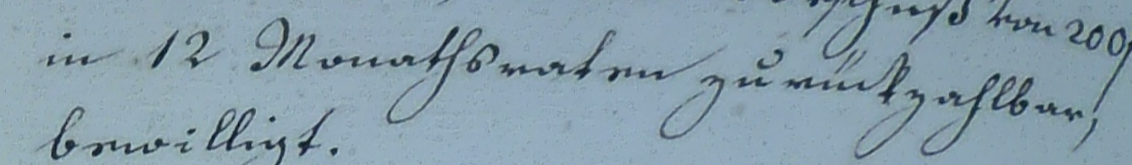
in 12 Monathsraten zurückzahlbar,
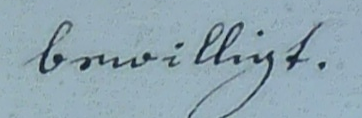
bewilligt.
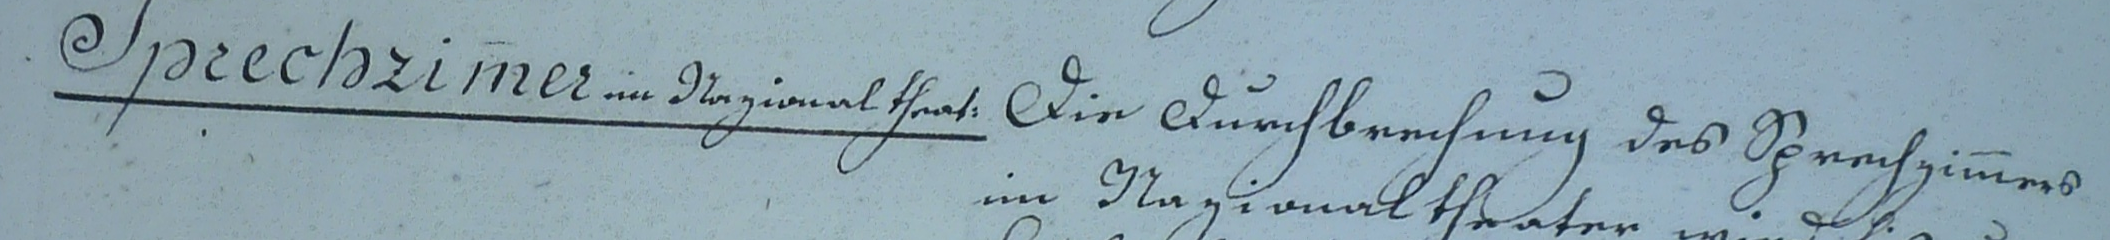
Sprechzim̅er im Nazionaltheat: Die Durchbrechung das Sprechzim̅ers
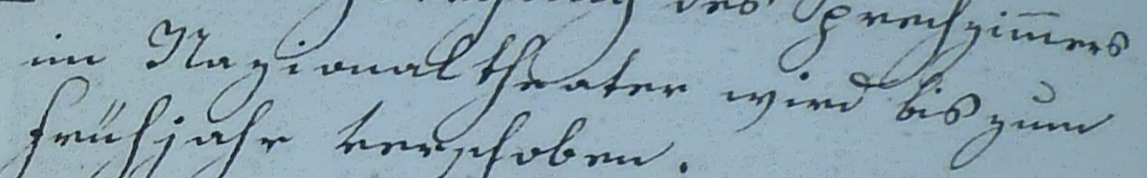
im Nazionaltheater wird bis zum
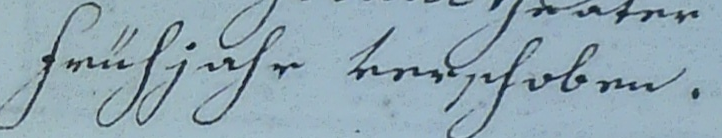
Frühjahr verschoben.
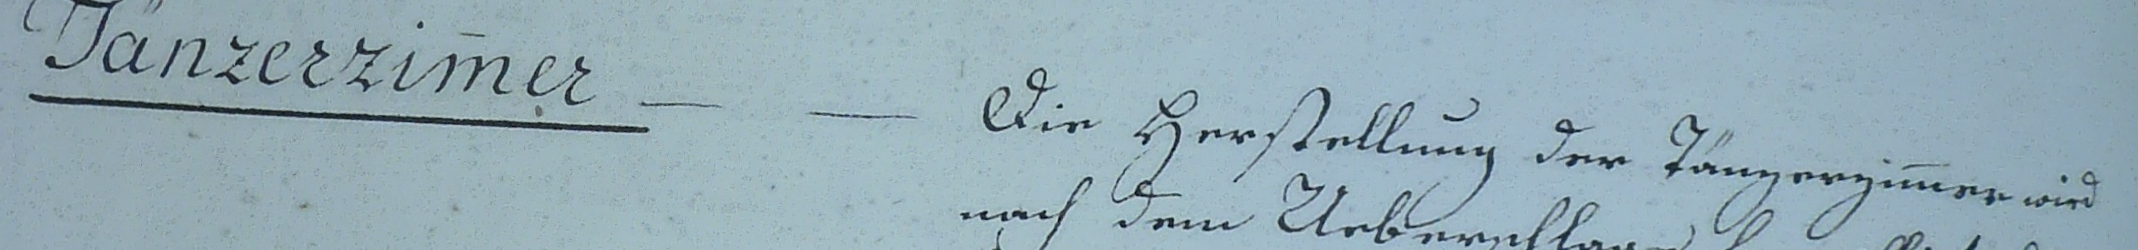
Tänzerzim̅er _ _ Die Herstellung der Tänzerzim̅er wird
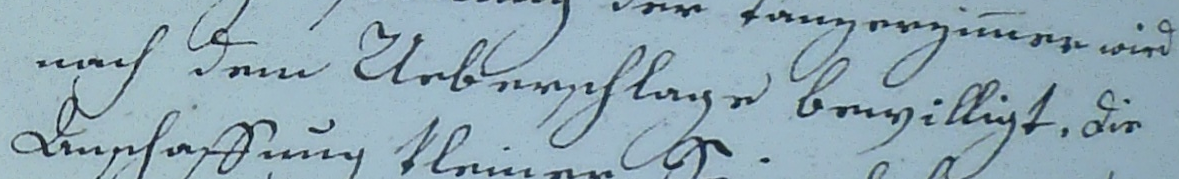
nach dem Ueberschlage bewilligt, die
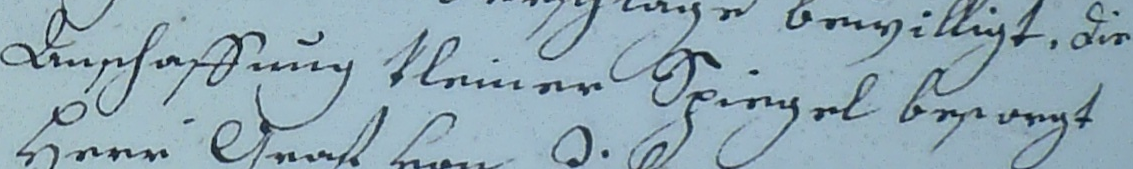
Anschaffung kleiner Spiegel besorgt
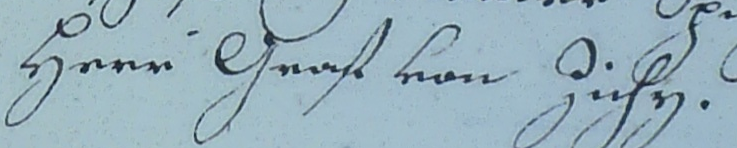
Herr Graf von Zichy.
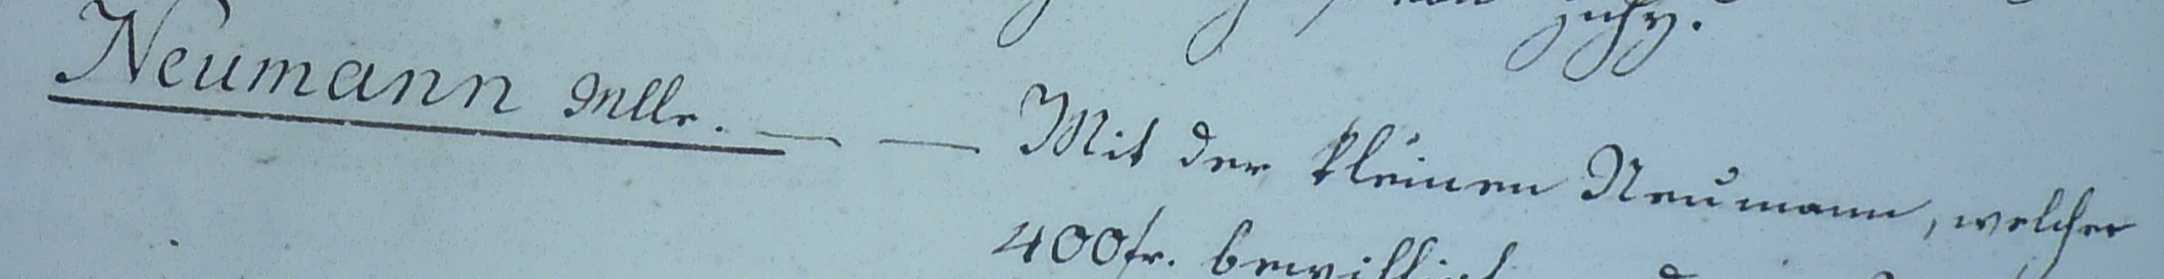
Neumann Mlle. __ __ Mit der kleinen Neumann, welcher
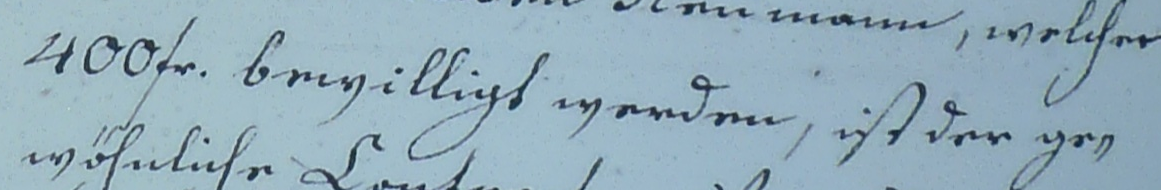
400fr. bewilligt werden, ist der ge¬
